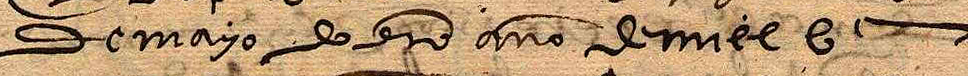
de mayo do dito ano de mill bc
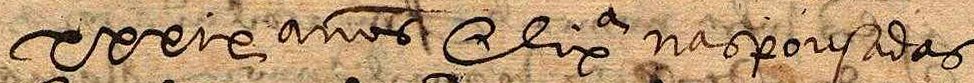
xxxix anōs ē lixa nas pousadas
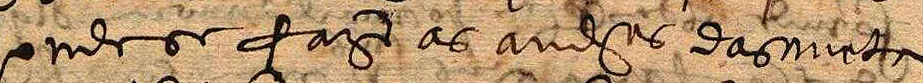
honde se fazē as audjas da sancta
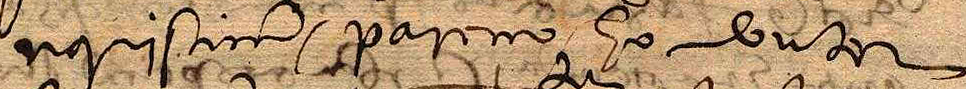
Jnqujsiçā / pareceo ho doutor
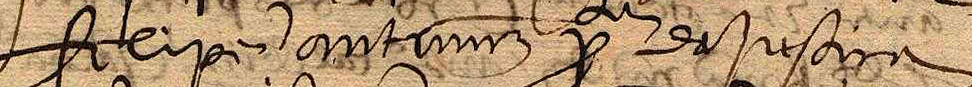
felipe antunez ꝓtor da Justiça
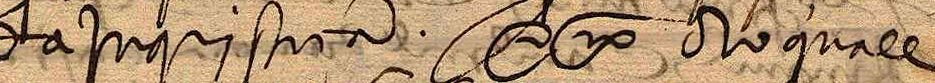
da Jnqujsiçā / e c̄ꝭ Ao quall
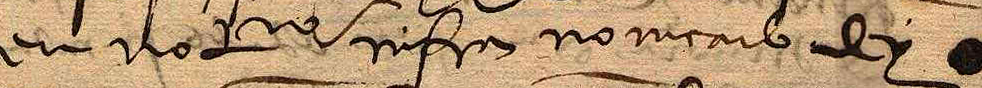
eu notro infra nomeado dey
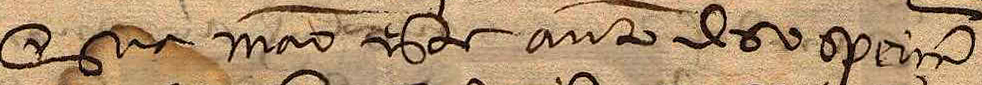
ē sua mão este auto de sospeiçā
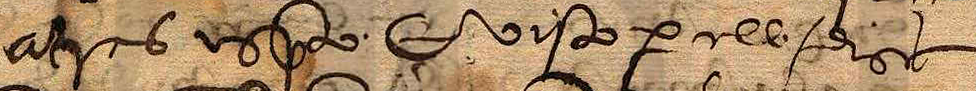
atras espto E visto ꝑ elle / dise
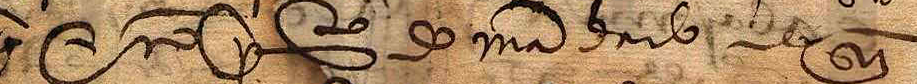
q̄ ē c̄op̄mto do mādado do s̄or
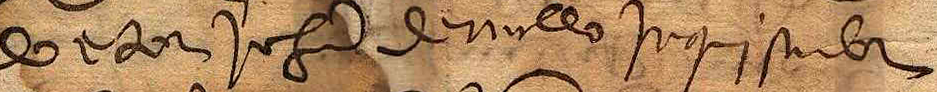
doctor Johā de mello Jnqujsidor
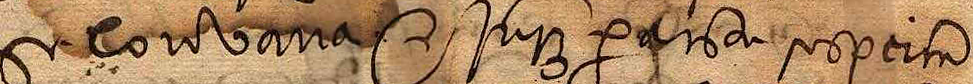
se louvaua ē Jujz ꝑa esta sospeiçā
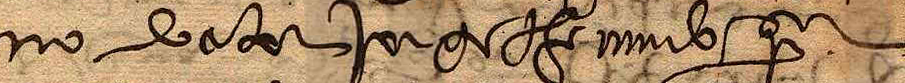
no doctor Jorge themudo ꝓsor
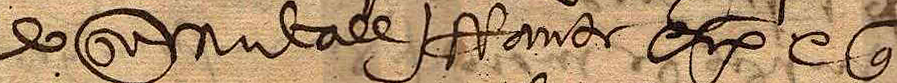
do s̄or cardeall Jffante e c̄ꝭ e q̄
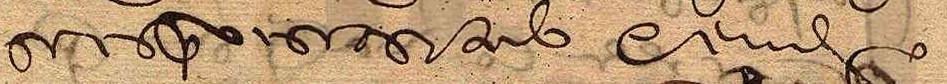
se esp̄vese asj tudo e eu djo
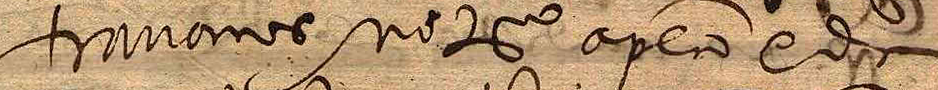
trauaços notro ap̄lco e da
